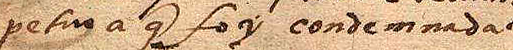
petuo a q̄ foy condemnada.
